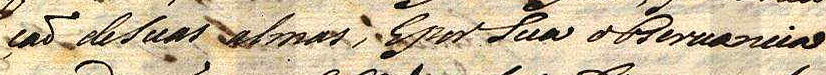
çaõ de suas almas, E por sua obseruancia
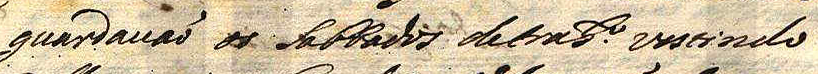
guardauaõ os sabbados de trab.o vestindo
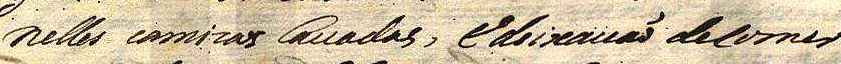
nelles camizas lauadas, E deixauaõ de comer
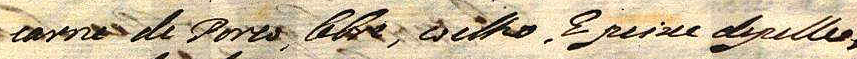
carne de Porco, lebre, coelho E peixe de pelle,
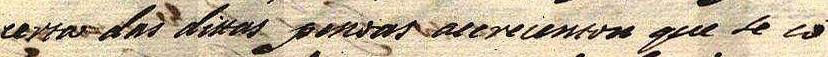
certa das dittas pessoas acrecentou que se co
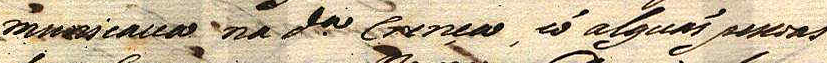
municaua na d.a crença, cō alguas̄ pessoas
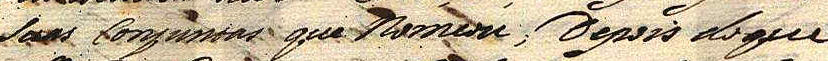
suas conjuntas que Nomeou, depois do que
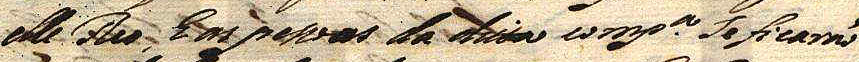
elle Reo, E as pessoas da dita comp.a se ficaraõ
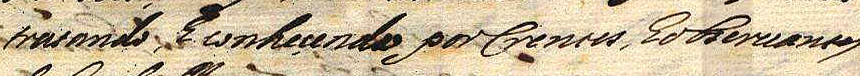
tratando, E conhecendo por Crentes, E obseruantes
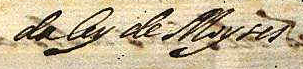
da ley de Moyses
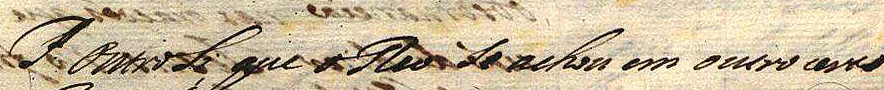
P. Outrosi que o Reo se achou em outro certo
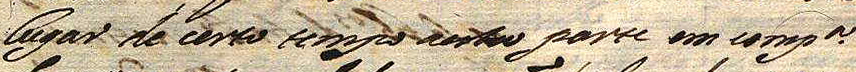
lugar de certo tempo a esta parte em comp.a
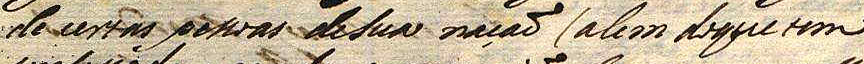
de certas pessoas de sua naçaõ / alem do que tem
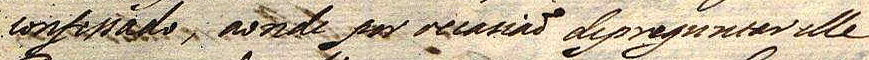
confessado, aonde por occasiaõ de preguntar elle
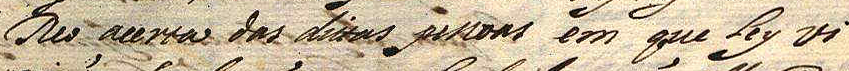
Reo acerca das dittas pessoas em que ley vi
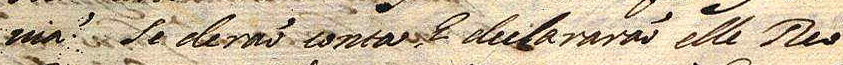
uia? se deraõ conta E declararão elle Reo
